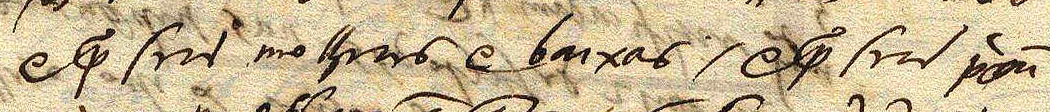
e p̄o serē molheres e baixas / e p̄o serē p̄gū
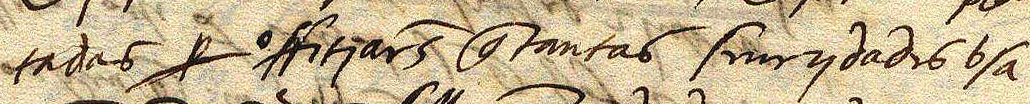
tadas ꝑ offitjaes q̄ tantas seuerjdades vsa
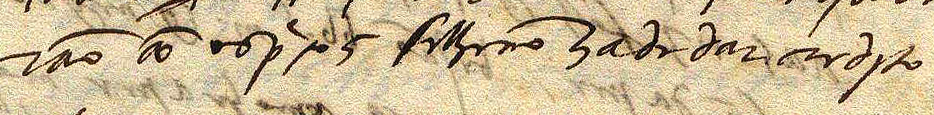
rão c̄o os p̄sos se lhe nō ha de dar credjto
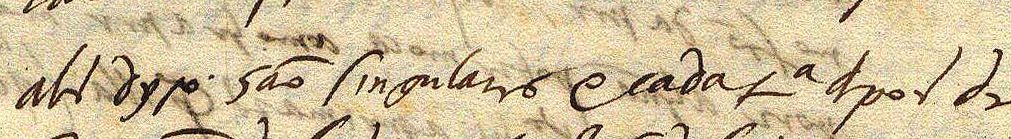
alē dyso são singulares e cada ta depoē de
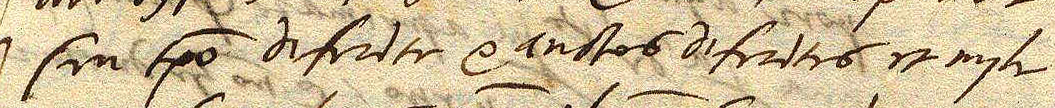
seu tp̄o diferēte e auctos diferētes et mjle
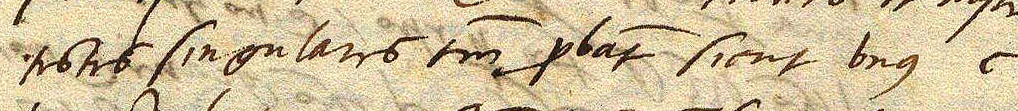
testes singulares tm̄ ꝓbat̄ singulares nō
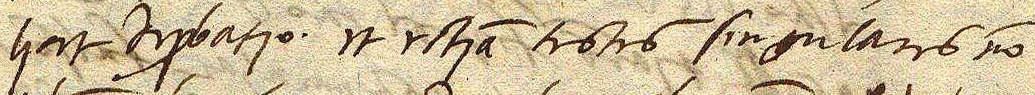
ljcet de ꝓbatjo. et estjā testes singulares nō
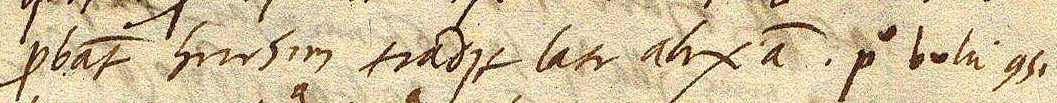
ꝓbat̄ heresim tradjt late alexā. po bolu ꝯsi
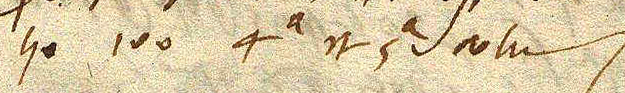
ljo 100 4a et 5a colu
